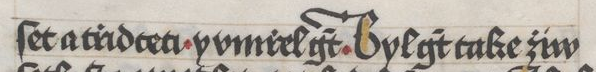ſet a tṙidceti.y vmṙel ḡt. Byl ḡt take żíw
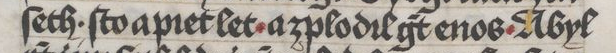ſeth.ſto a piet let.a zplodil ḡt enos.A byl
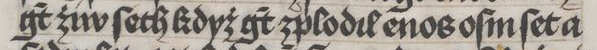ḡt żíw ſeth kdyż ḡt zplodil enos oſm ſet a
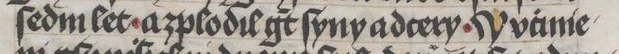ſedm let.a zplodil ḡt ſyny a dcery.Y vċiníe¬
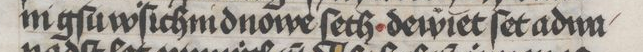ní gſu wẛichni dnowe ſeth.dewiet ſet a dwa¬
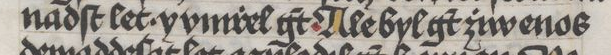nadſt let. y vmṙel ḡt. Ale byl ḡt żiw enos
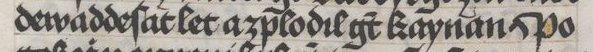dewaddeſat let a zplodil ḡt kaynan.Po
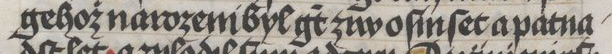gehoż narození byl ḡt ziw oſm ſet a patna¬
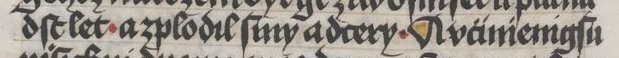dſt let.a zplodil ſiny a dcery.A vċíníeni gſu
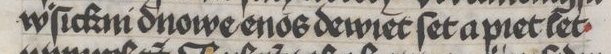wẛickni dnowe enos dewiet ſet a piet let.
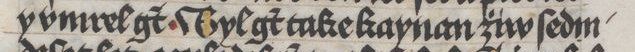y vmrel ḡt. Byl ḡt take kaynan żíw ſedm¬
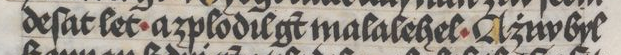deſat let. a zplodil ḡt malalehel.A żiw byl
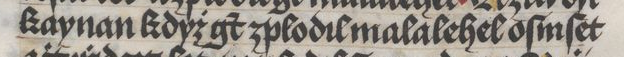kaynan když ḡt zplodil malalehel oſm ſet
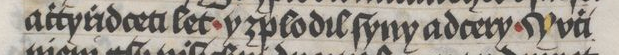a ċtyṙidceti let. y zplodil ſyny a dcery.Y vċí¬
